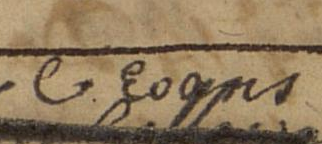C. Evans
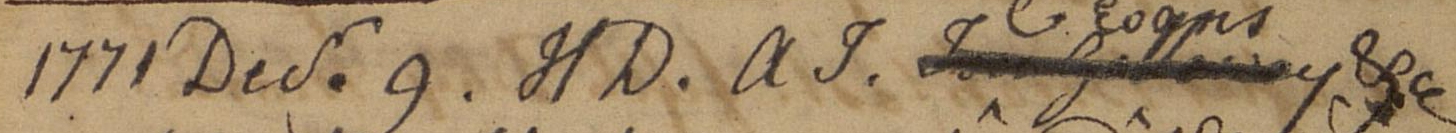1771 Dec^r.9. HD. AJ. [Jos. Galloway] ^ &ce
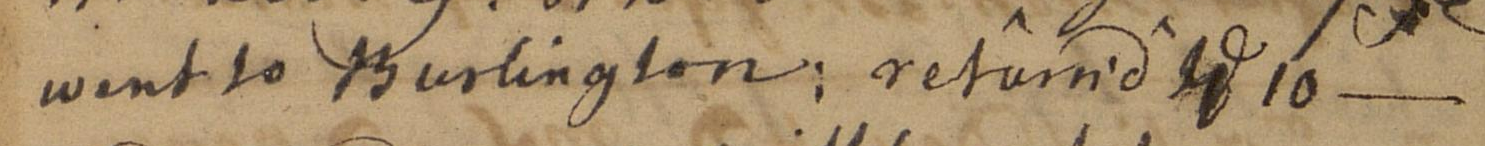went to Burlington; return'd y^e 10-
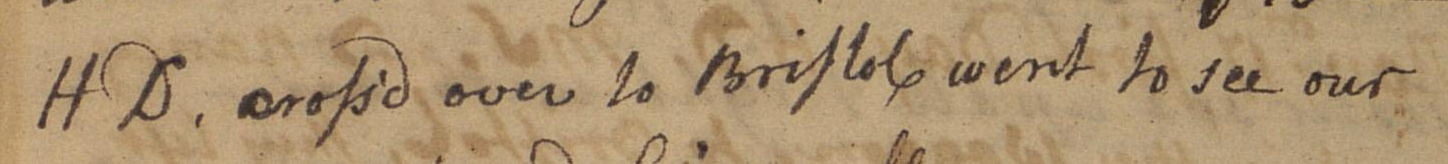HD. cross'd over to Bristol went to see our
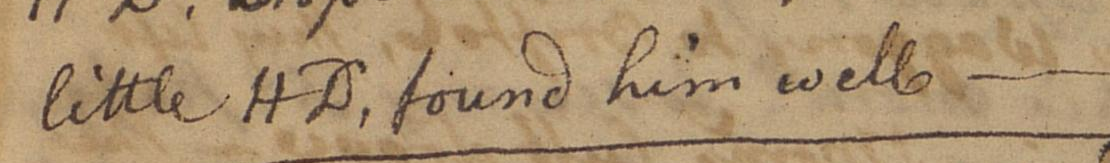little HD, found him well-
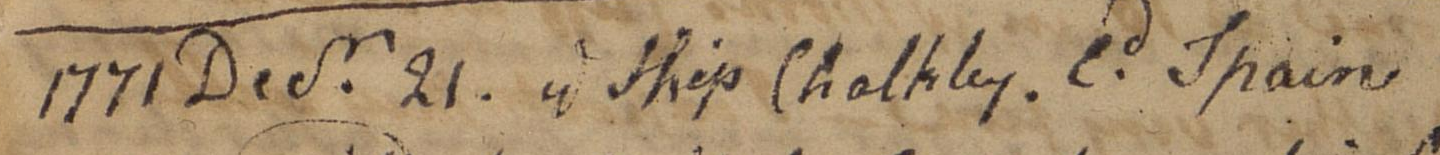1771 Dec^r. 21. y^e Ship Chalkley. E^d. Spain
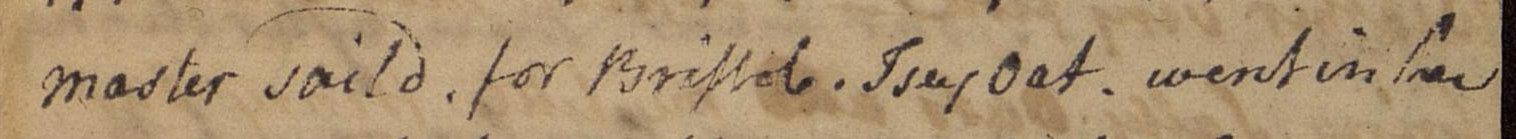master saild for Bristol. Isal Oat. went in her
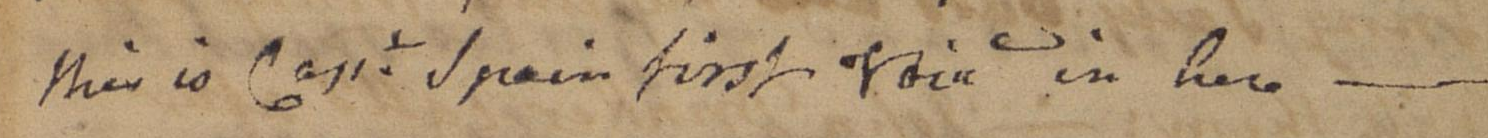this is Cap't Spain first Voir? in here-
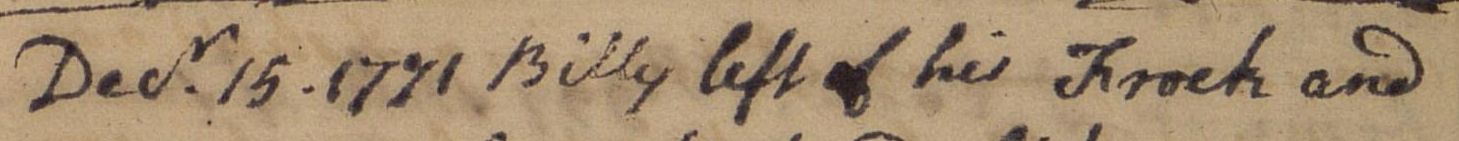Dec^r. 15. 1771 Billy left of his Frock and
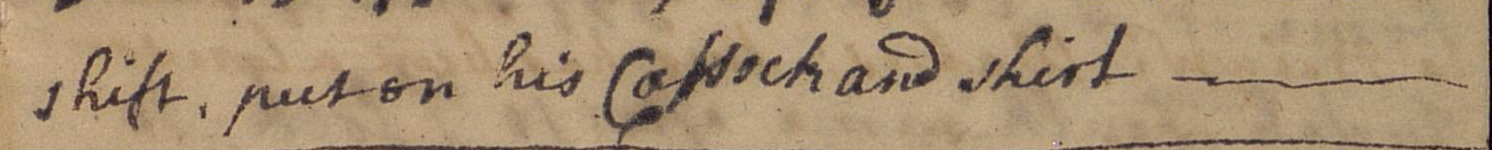shift, put on his Cassoch and shirt-
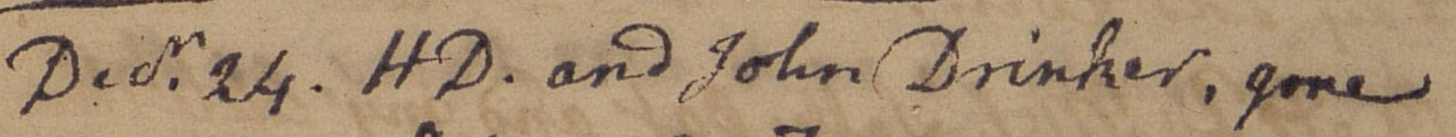Dec^r. 24. HD. and John Drinker, gone
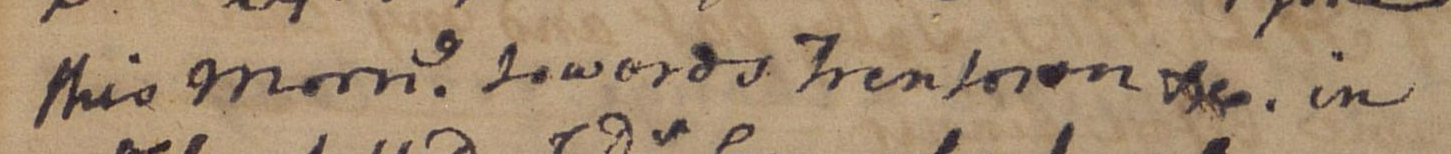this morn^g. towords Trentown &c, in
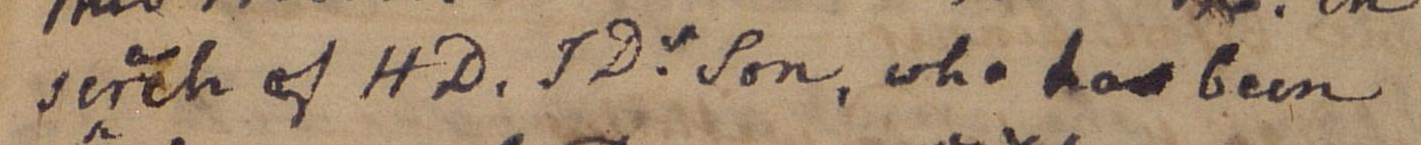se^arch of HD. SD^s. Son, who has been
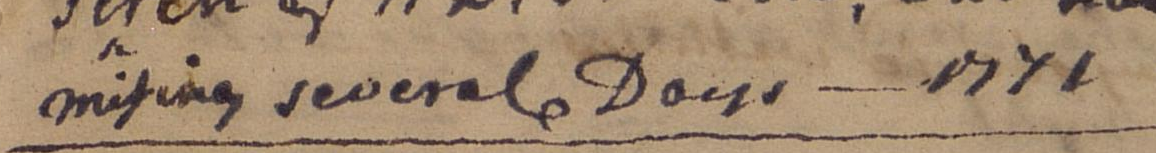missing several Days- 1771
